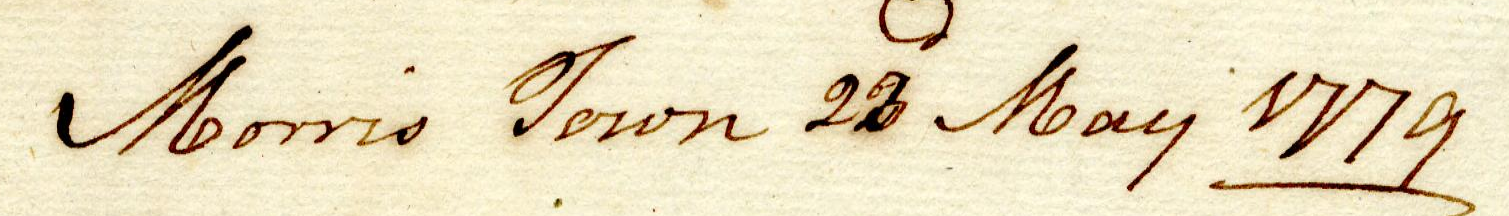Morris Town 23^d May 1779
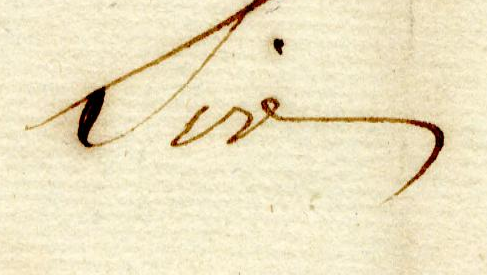Sir
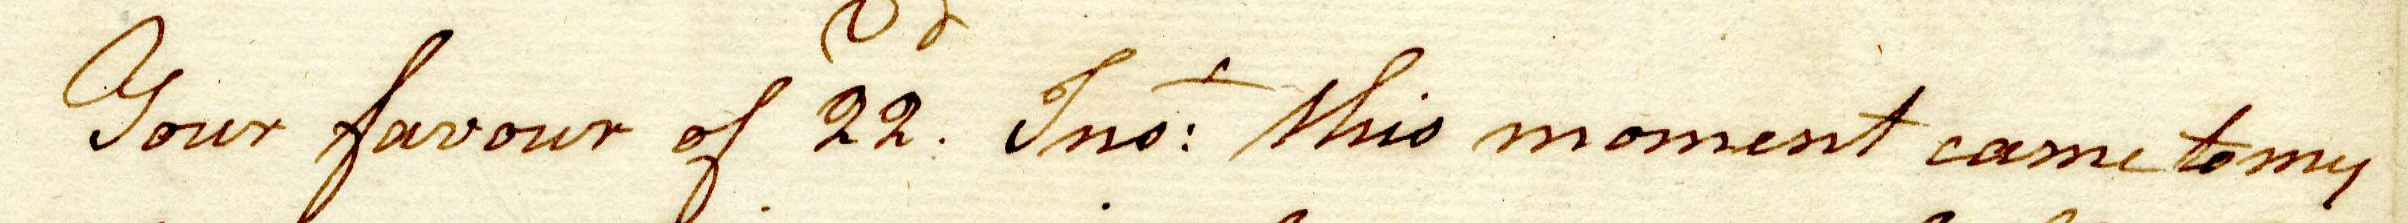Your favour of 22^d. Ins^t: this moment came to my
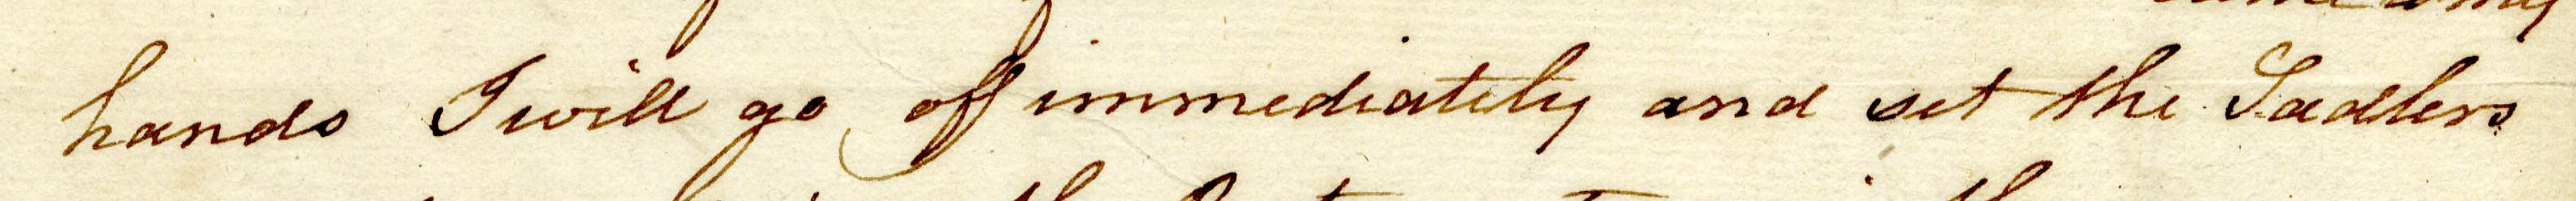hands I will go off immediately and set the Sadlers
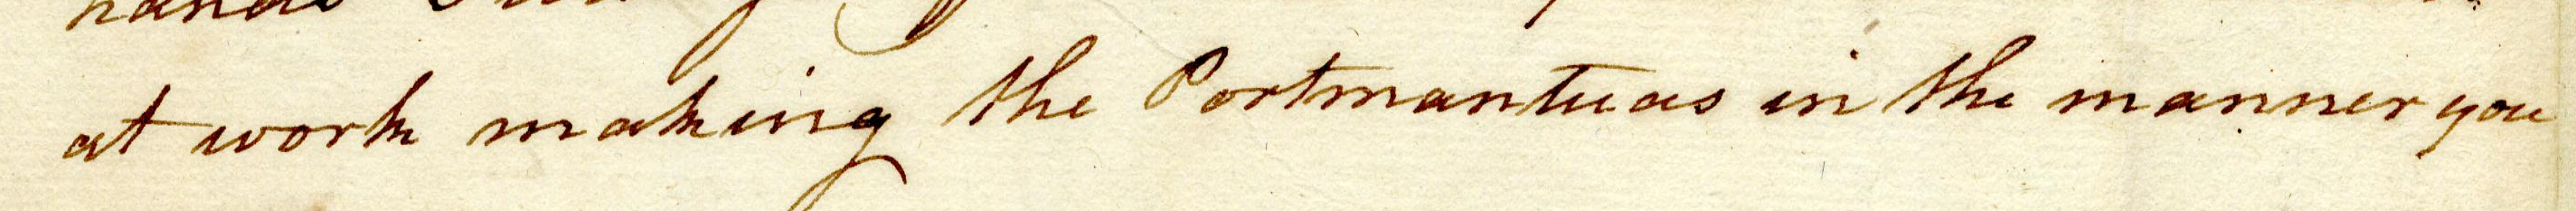at work makingthe Portmantuos in the manner you
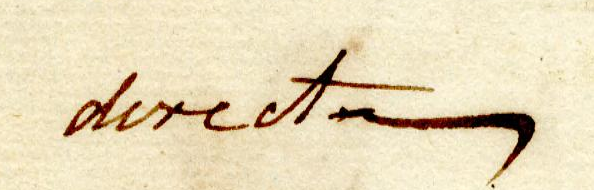direct-
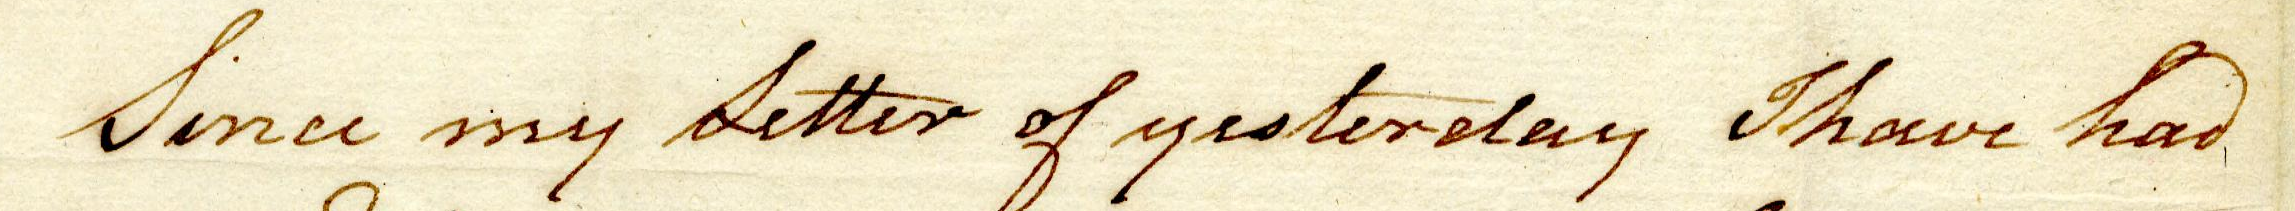Since my Letter of yesterday I have had
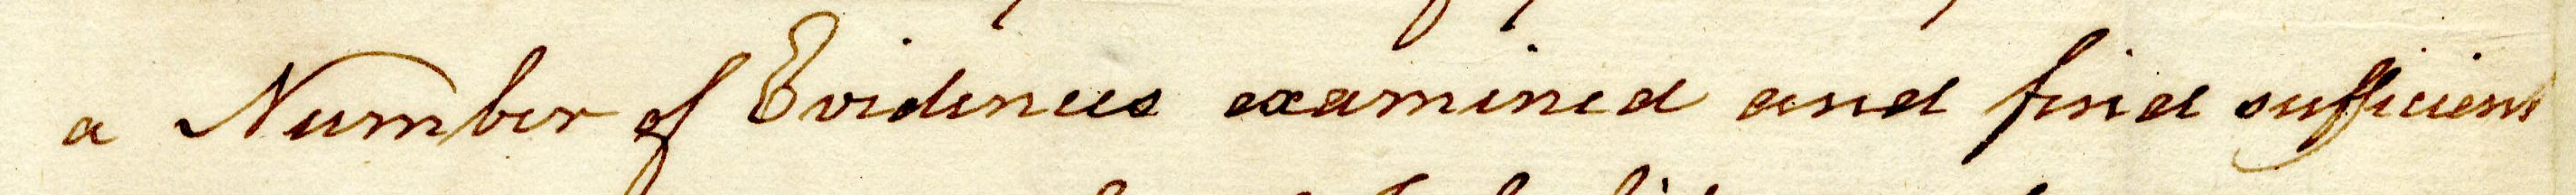a Number of Evidences examined and find sufficient
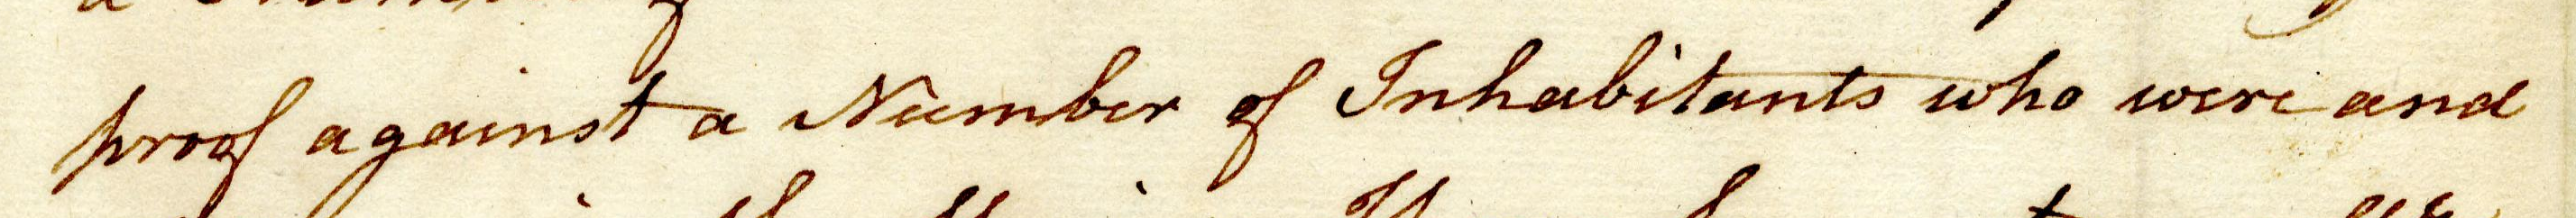proof against a Number of Inhabitants who were and
